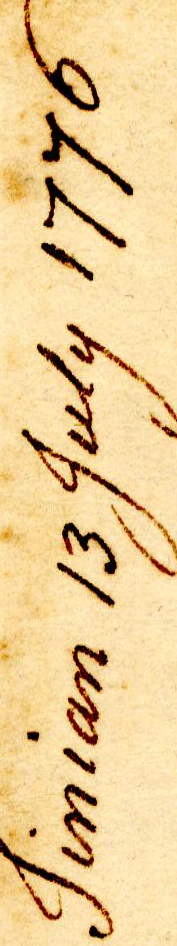Tinian 13 July 1776
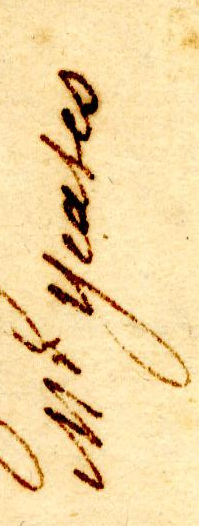M^r Yeates
